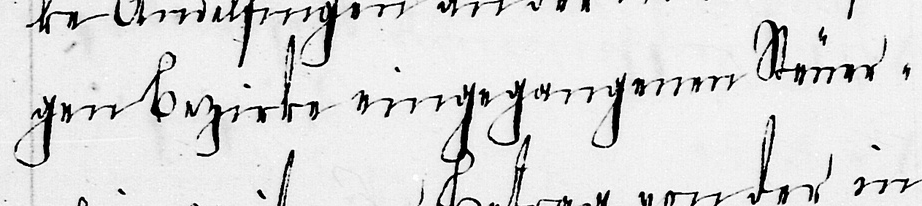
gen Bezirke eingegangenen Steuer
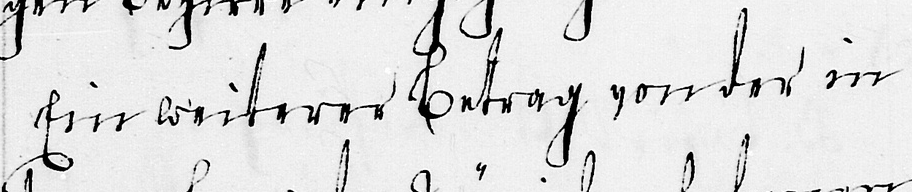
Ein weiterer Betrag von der in
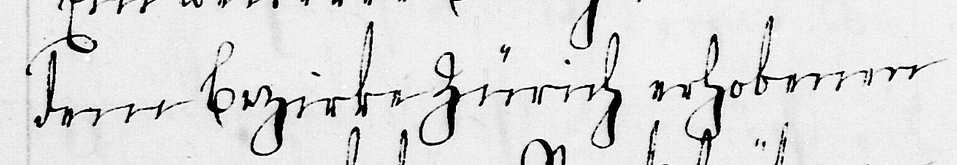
dem Bezirke Zürich erhobenen
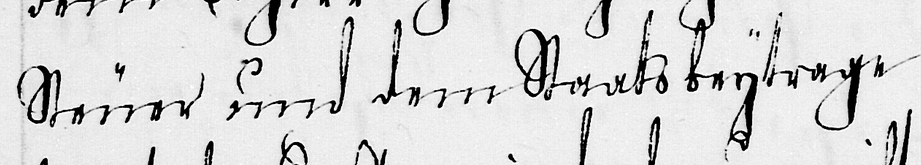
Steuer und dem Staatsbeytrage
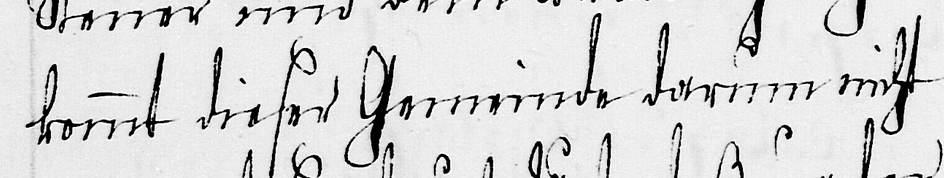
kommt dieser Gemeinde darum nicht
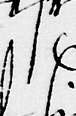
.
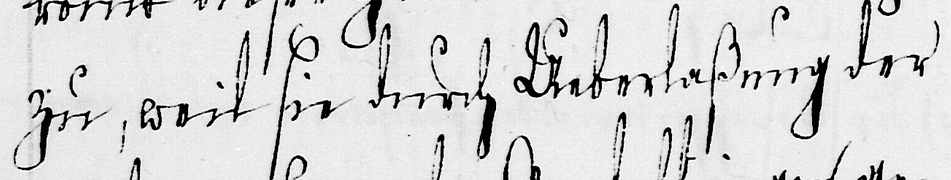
zu, weil sie durch Ueberlaßung der
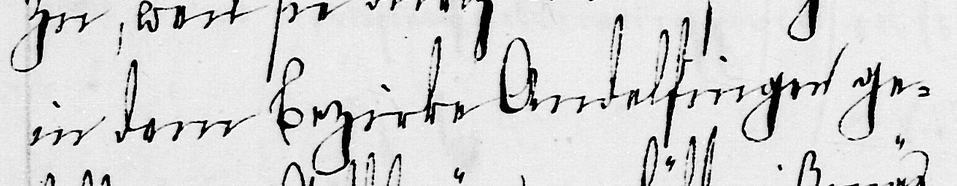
in dem Bezirke Andelfingen ge¬
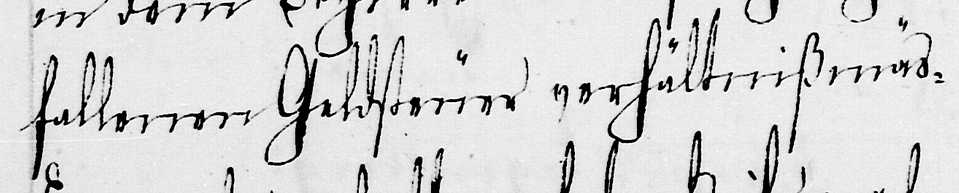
fallenen Geldsteuer verhältnißmä¬
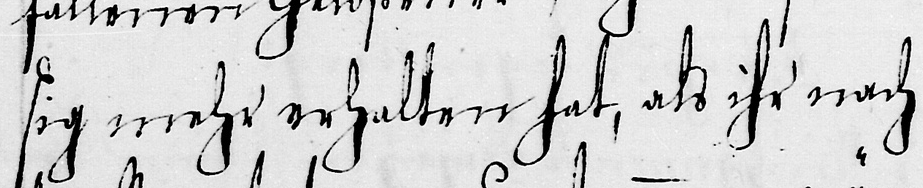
ßig mehr erhalten hat, als ihr nach
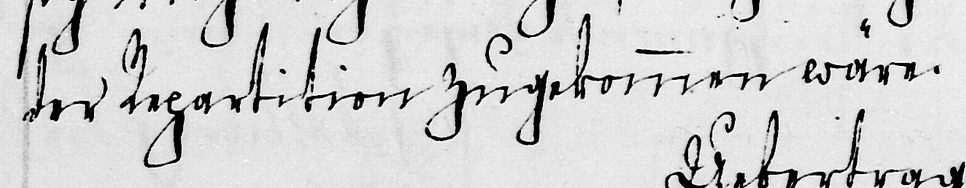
der Repartition zugekommen wäre.
